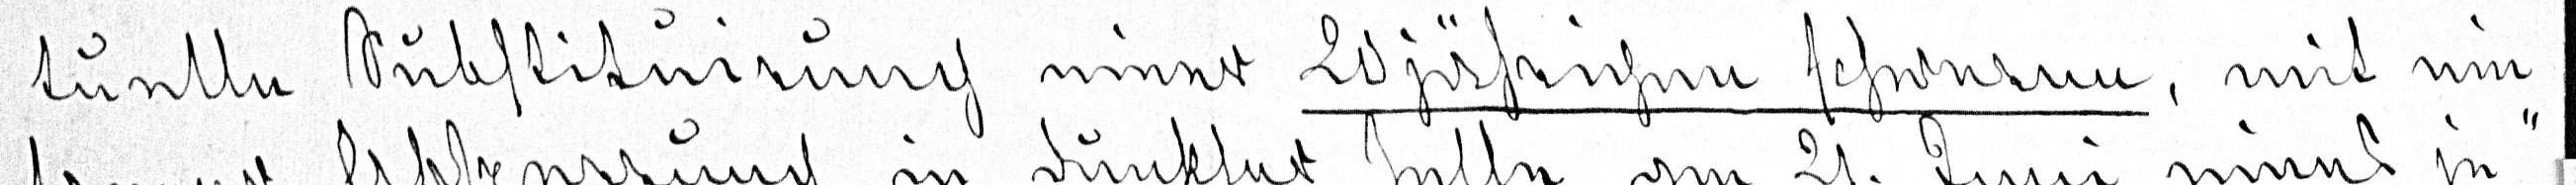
tuelle Substituirung einer 20jährigen schweren, mit ein¬
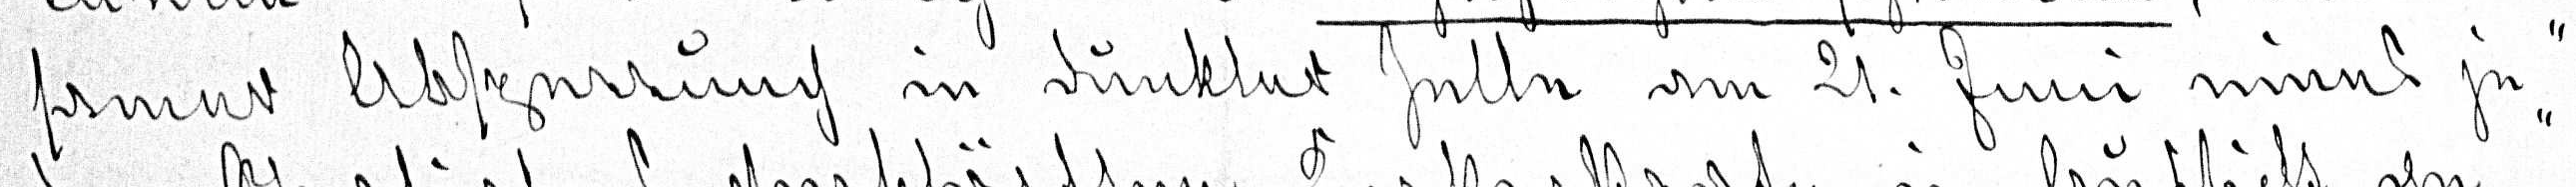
samer Absperrung in dunkler Zelle am 21. Juni eines je¬
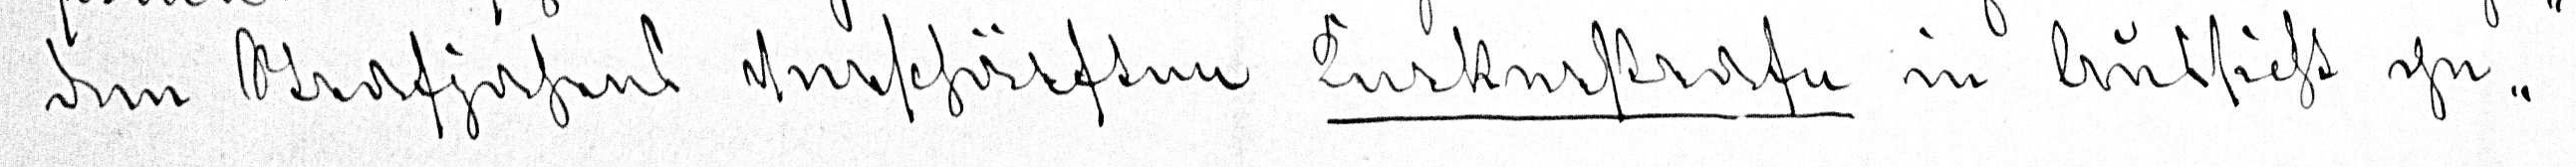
dem Strafjahres verschärften Kerkerstrafe in Aussicht ge¬
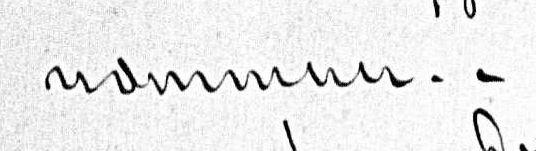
nommen.
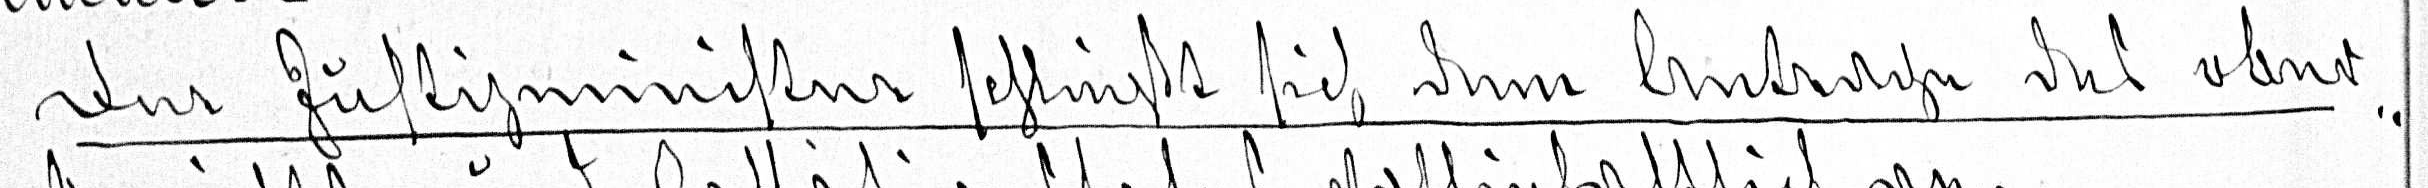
Der Justizminister schließt sich dem Gutachten des ober¬
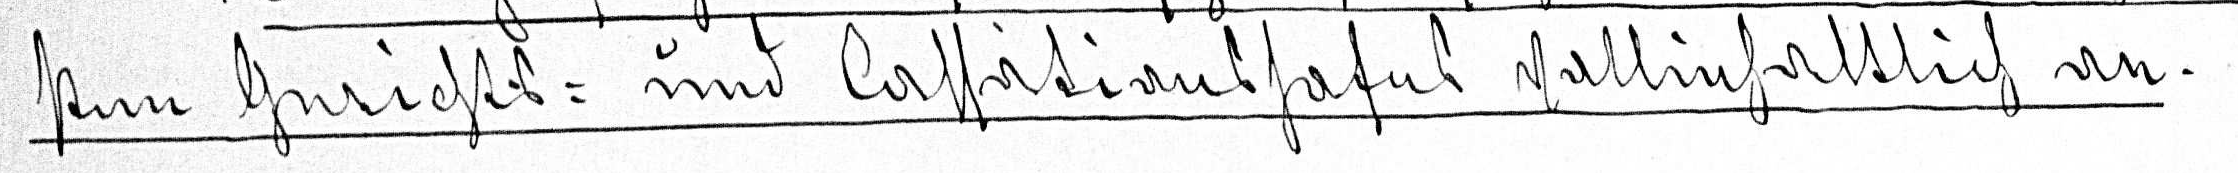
sten Gerichts- und Cassationshofes vollinhaltlich an.
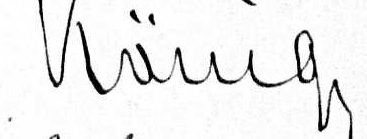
König
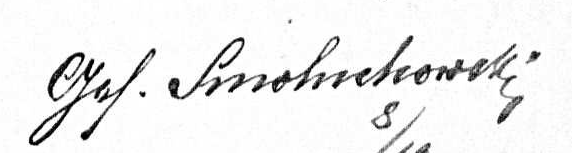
Ges. Smoluchowski
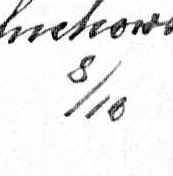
8/10
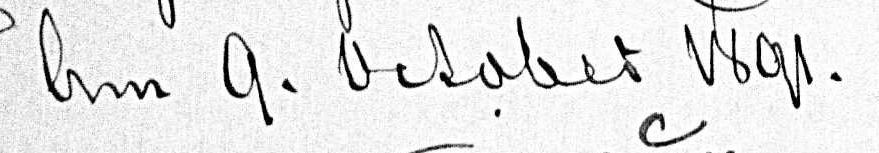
Am 9. October 1891
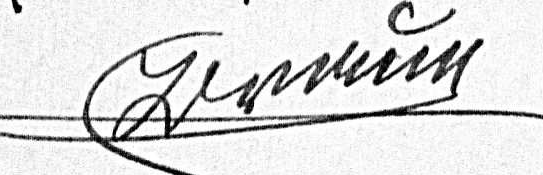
Braun
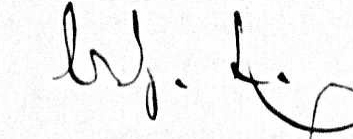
Ah E
